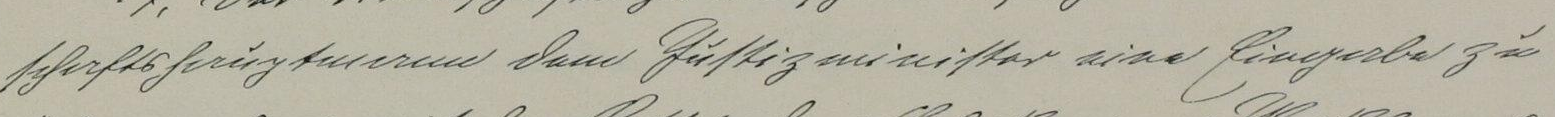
schaftshauptmann dem Justizminister eine Eingabe zu
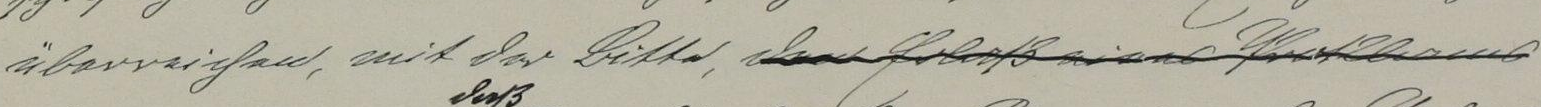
überreichen, mit der Bitte, den Erlaß eines Proklams
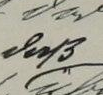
daß
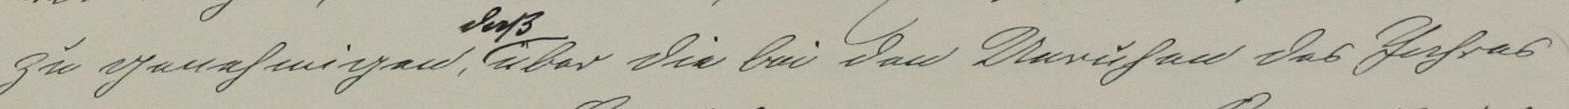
zu genehmigen, über die bei den Unruhen des Jahres
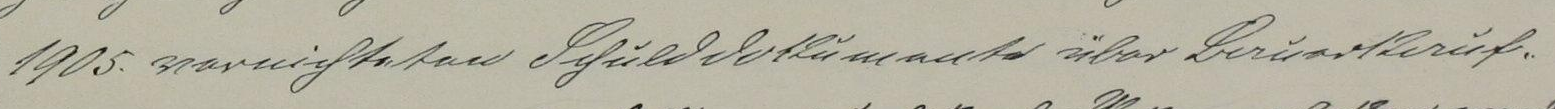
1905 vernichteten Schulddokumente über Bauerkauf-
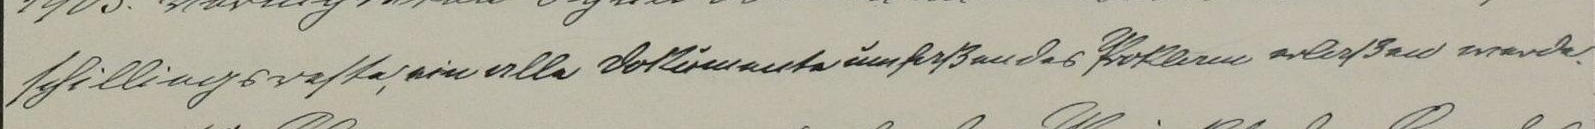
schillingsreste, ein alle Dokumente umfassendes Proclam erlaßen werde.
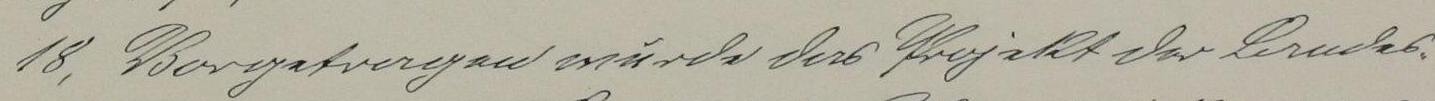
18. Vorgetragen wurde das Projekt der Landes-
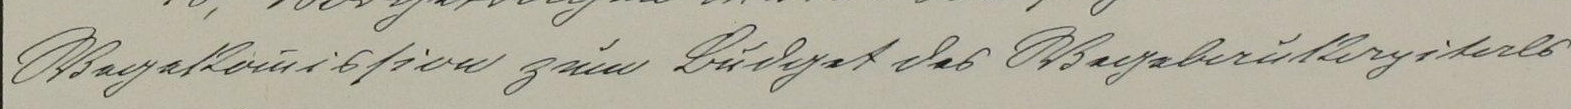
Wegekommission zum Budget des Wegebaukapitals
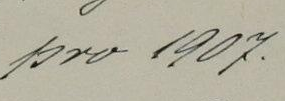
pro 1907.
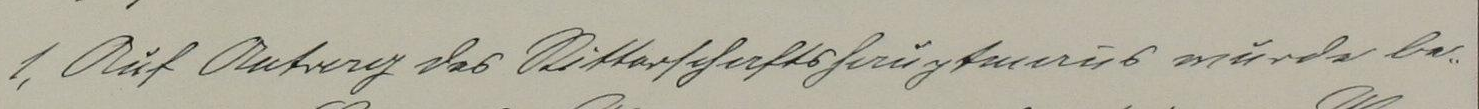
1. Auf Antrag des Ritterschaftshauptmanns wurde be-
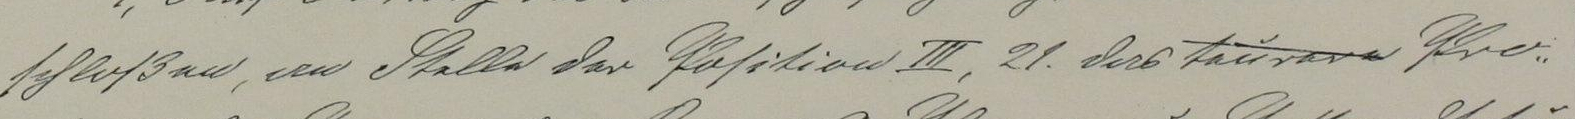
schloßen, an Stelle der Position III,21 das teurere Pro-
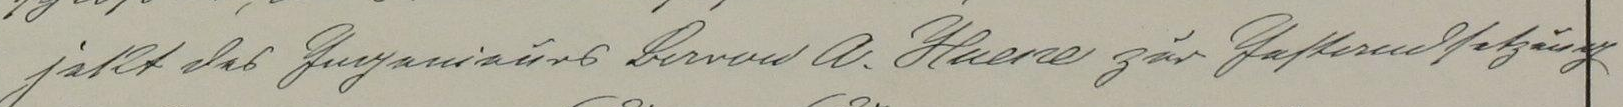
jekt des Ingenieurs Baron A. Huene zur Instandsetzung
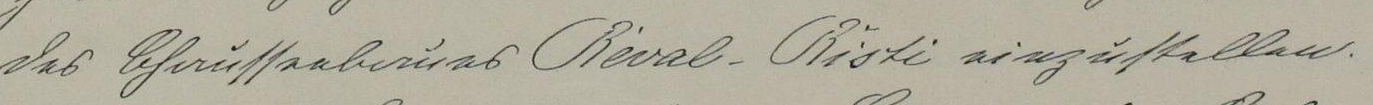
des Chausseebaues Reval-Risti einzustellen.
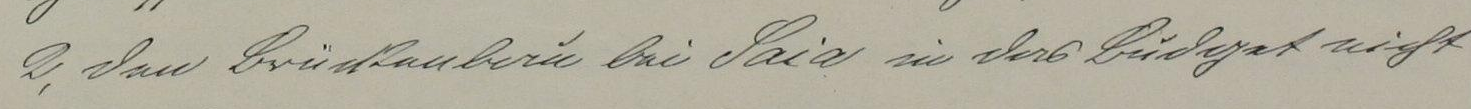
2. den Brückenbau bei Saia in das Budget nicht
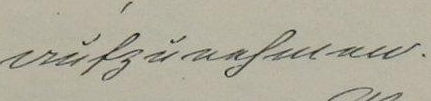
aufzunehmen.
